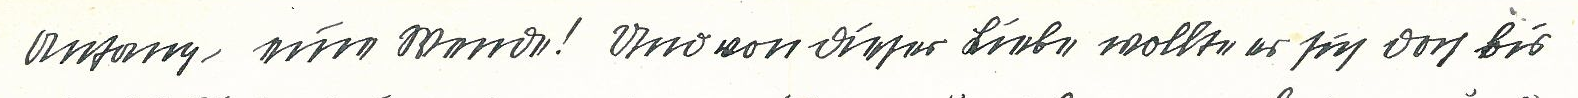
Anfang, eine Wende! Und von dieser Liebe wollte er sich doch bis
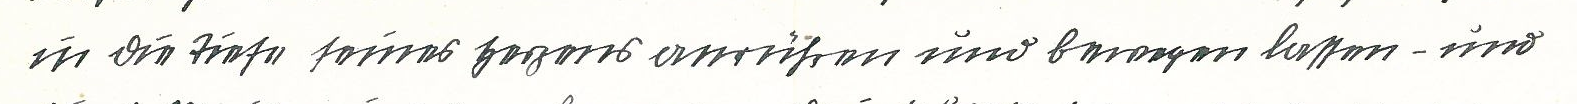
in die Tiefe seines Herzens anrühren und bewegen lassen – und
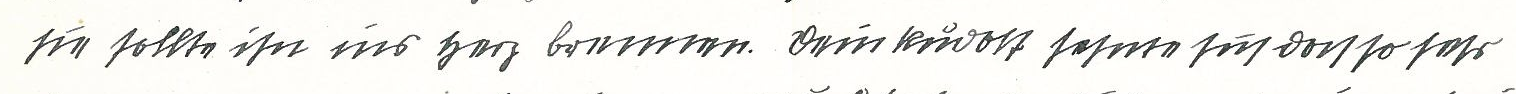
sie sollte ihn ins Herz brennen. Dein sehnte sich doch so sehr
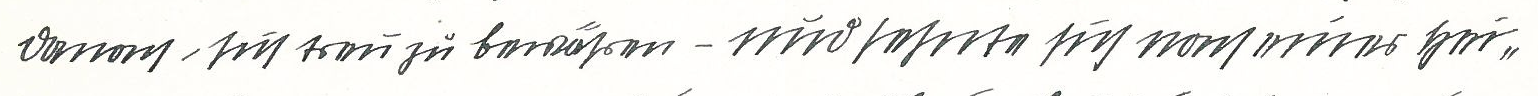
danach, sich treu zu bewähren – und sehnte sich nach seiner Hei¬
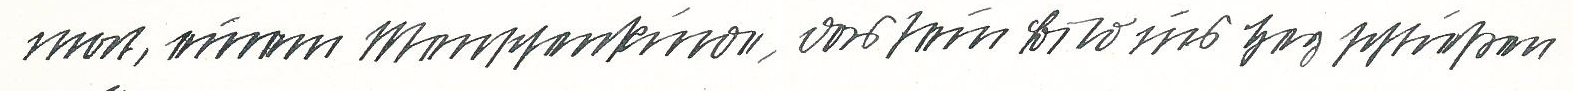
mat, einem Menschenkinde, das sein Bild ins Herz schließen
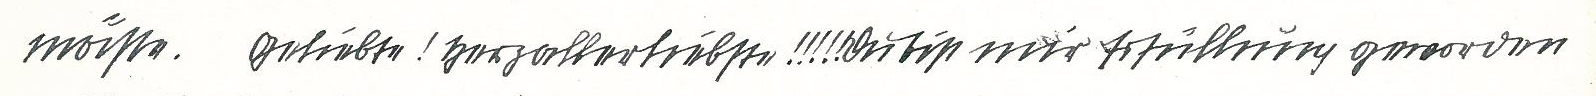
möchte. Geliebte! Herzallerliebste!!!!! Du bist mir Erfüllung geworden
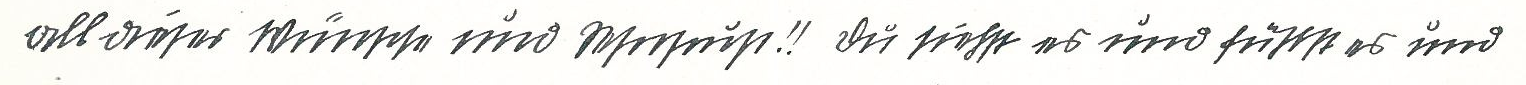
all dieser Wünsche und Sehnsucht!! Du siehst es und fühlst es und
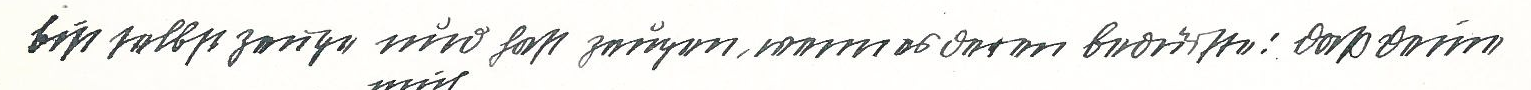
bist selbst Zeuge und hast Zeugen, wenn es deren bedürfte: daß Deine
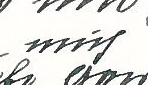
mich
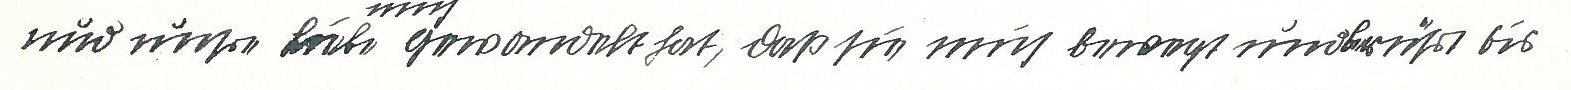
und unsre Liebe gewandelt hat, daß sie mich bewegt und berührt bis
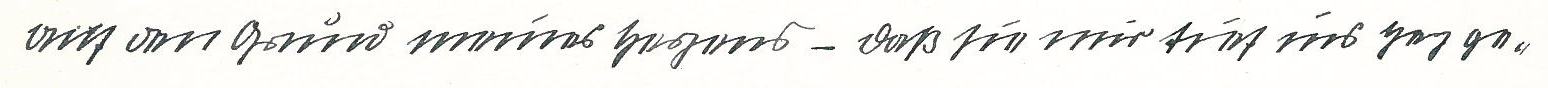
auf den Grund meines Herzens – daß sie mir tief ins Herz ge¬
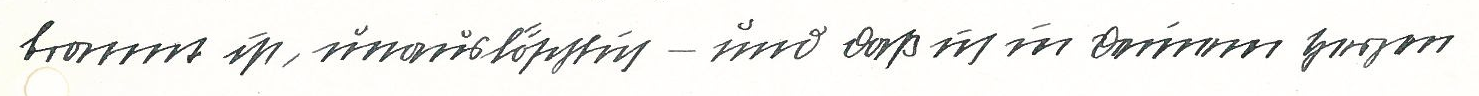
brannt ist, unauslöschlich – und daß ich in Deinem Herzen
